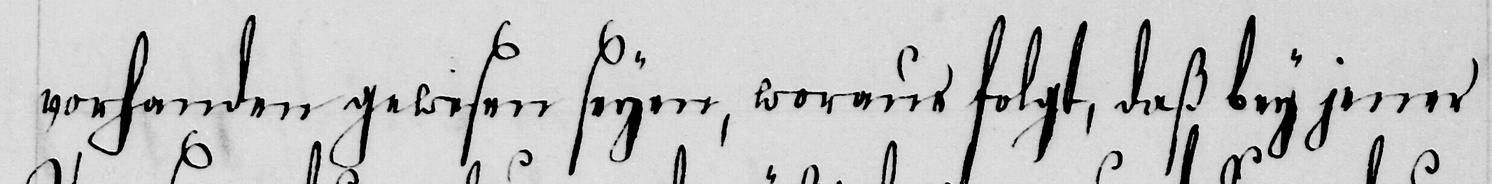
vorhanden gewesen seyen, woraus folgt, daß bey jener
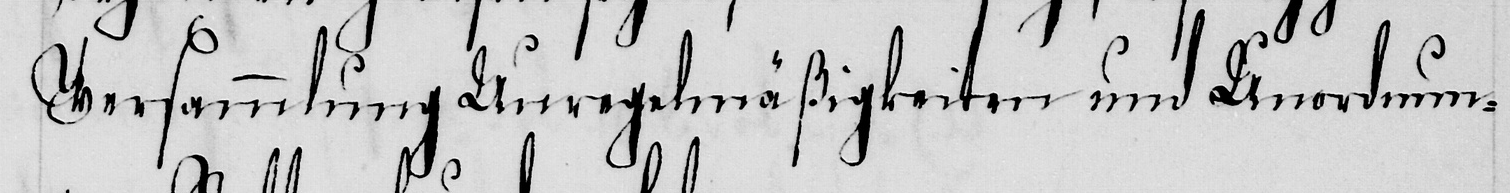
Versammlung Unregelmäßigkeiten und Unordnun¬
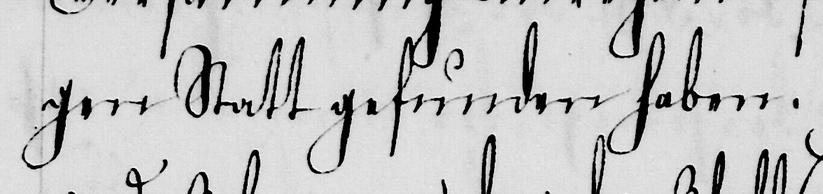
gen Statt gefunden haben.
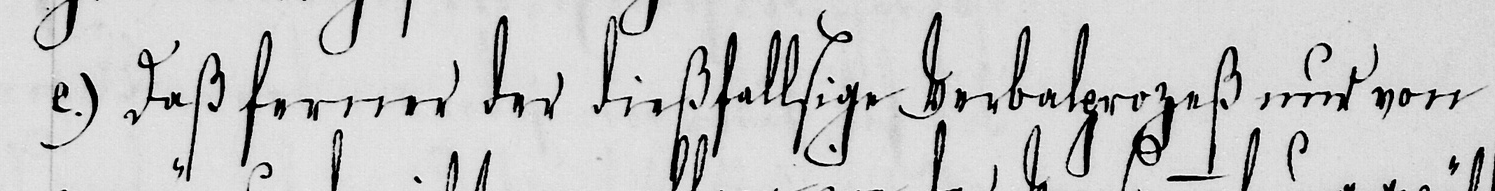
e.) Daß ferner der dießfallsige Verbalprozeß nur von
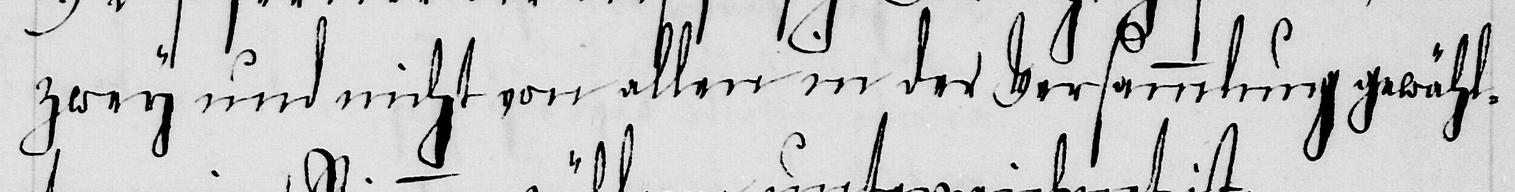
zwey und nicht von allen in der Versammlung gewähl¬
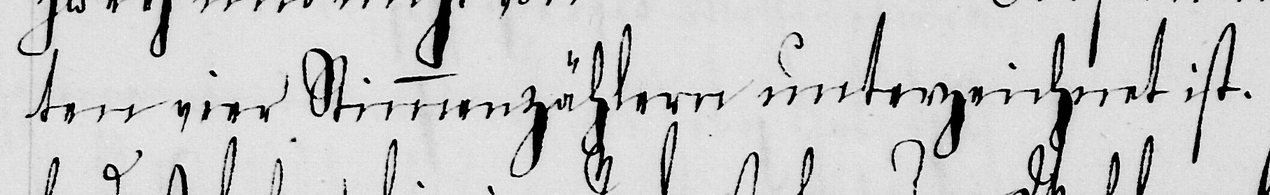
ten vier Stimmzählern unterzeichnet ist.
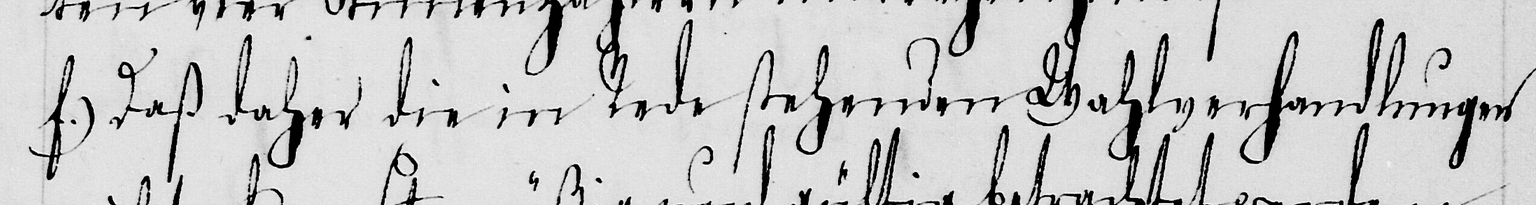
f.) Daß daher die in Rede stehenden Wahlverhandlungen
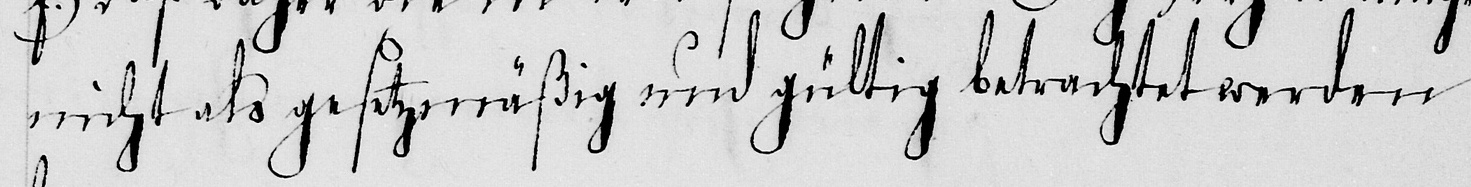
nicht als gesetzmäßig und gültig betrachtet werden
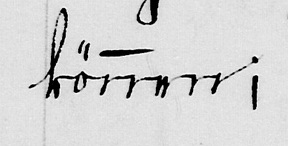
können;
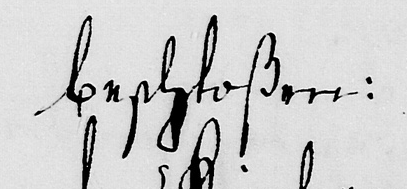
beschloßen:
